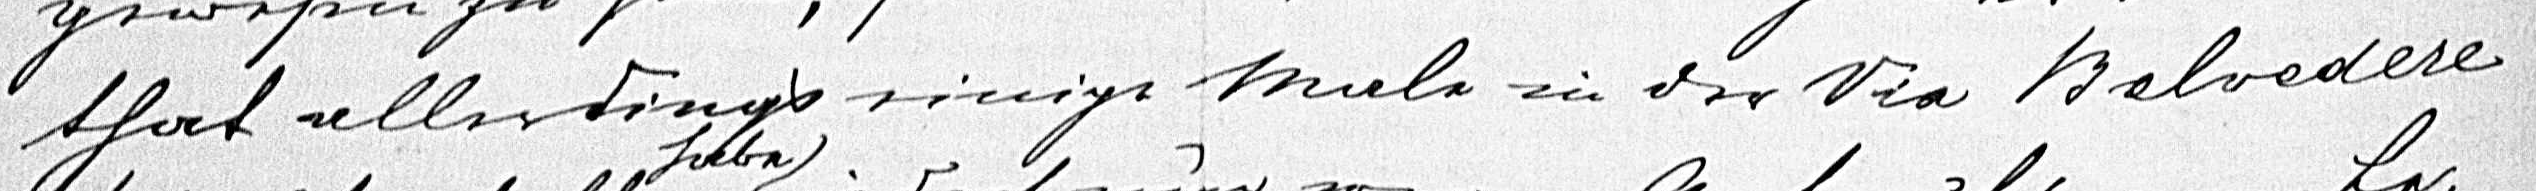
that allerdings einige Male in der Via Belvedere
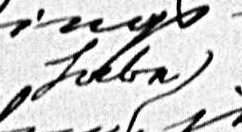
habe
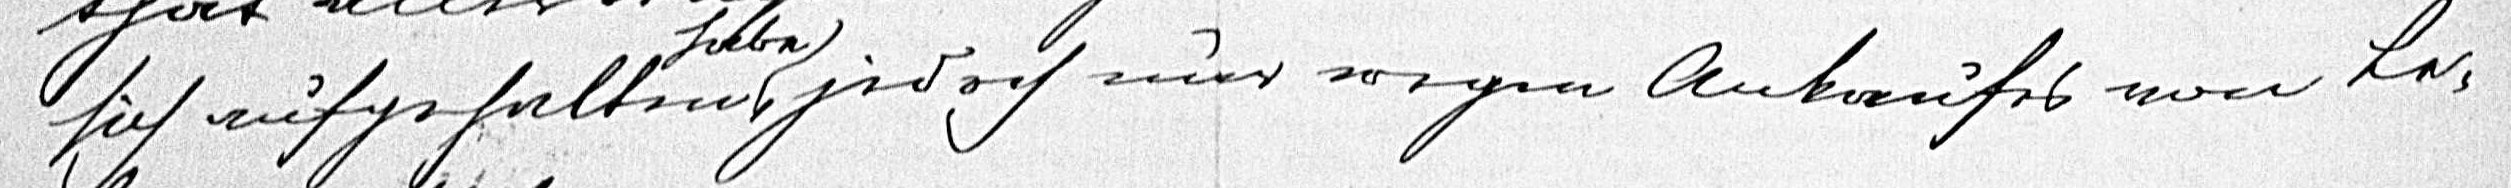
sich aufgehalten jedoch nur wegen Ankaufes von Le¬
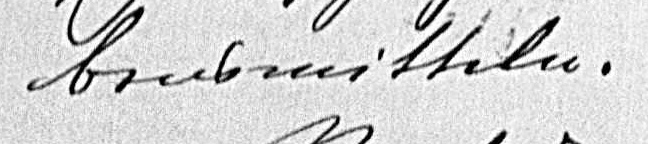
bensmitteln.
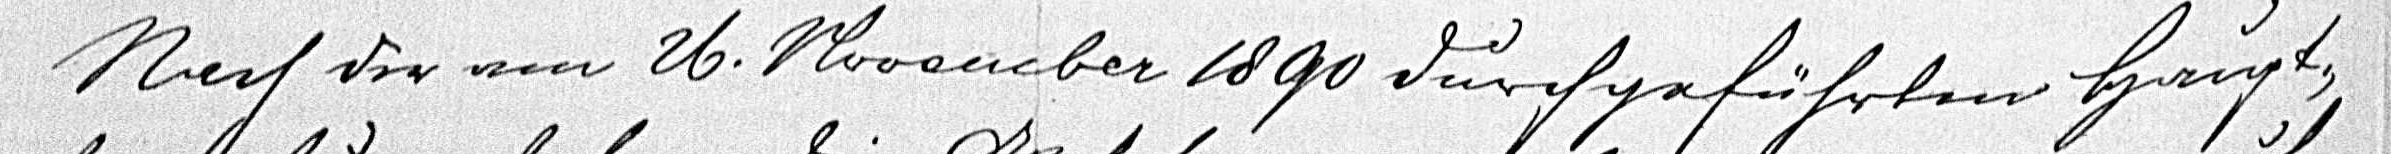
Nach der am 26. November 1890 durchgeführten Haupt¬
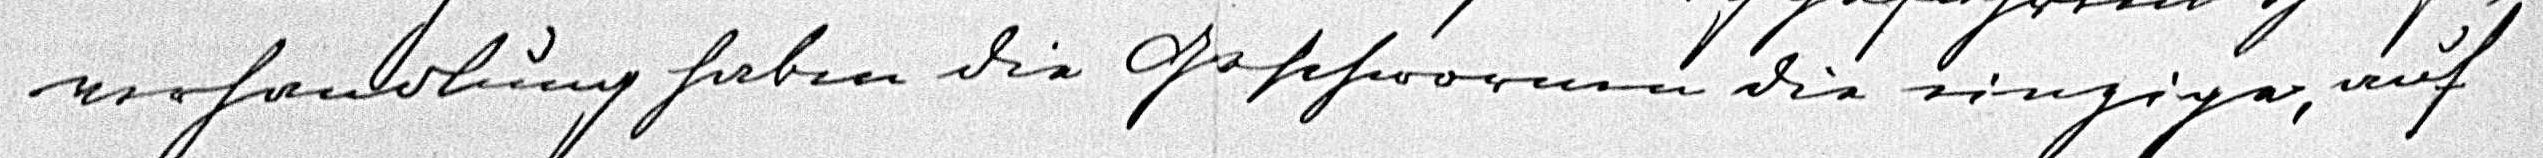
verhandlung haben die Geschworenen die einzige, auf
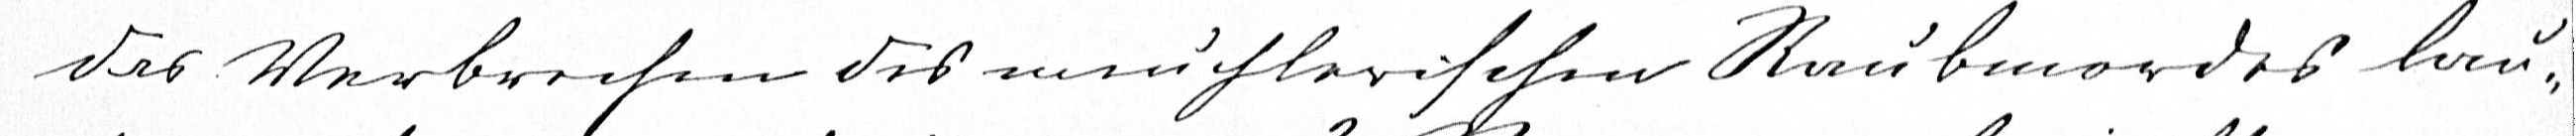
das Verbrechen des meuchlerischen Raubmordes lau¬
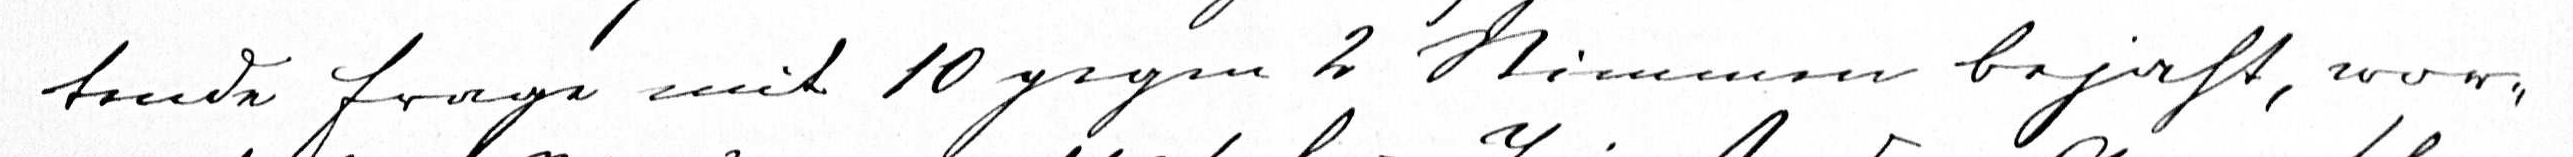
fende Frage mit 10 gegen 2 Stimmen bejaht, vor¬
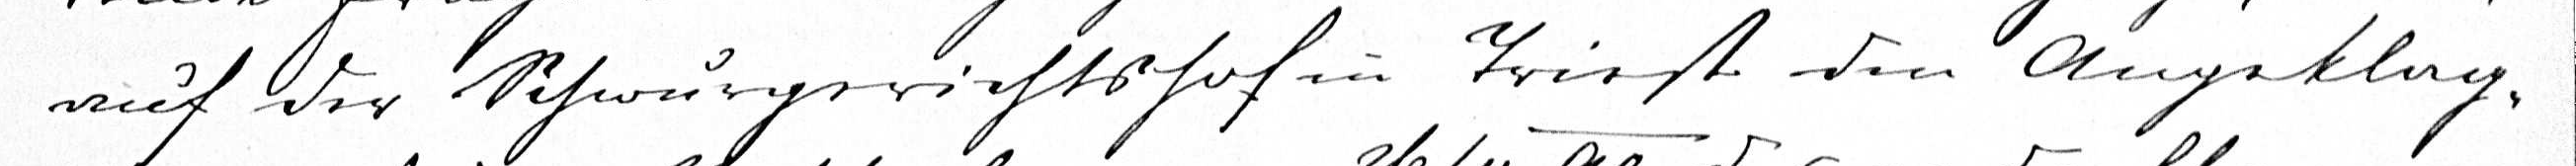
auf der Schurgerichtshof in Triest den Angeklag¬
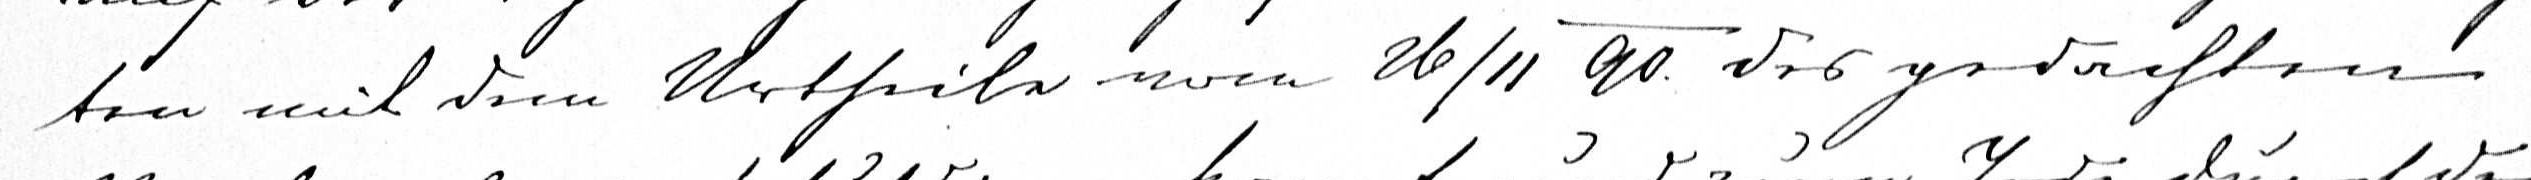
ten mit dem Urtheile von 26/11 1890 des gedachten
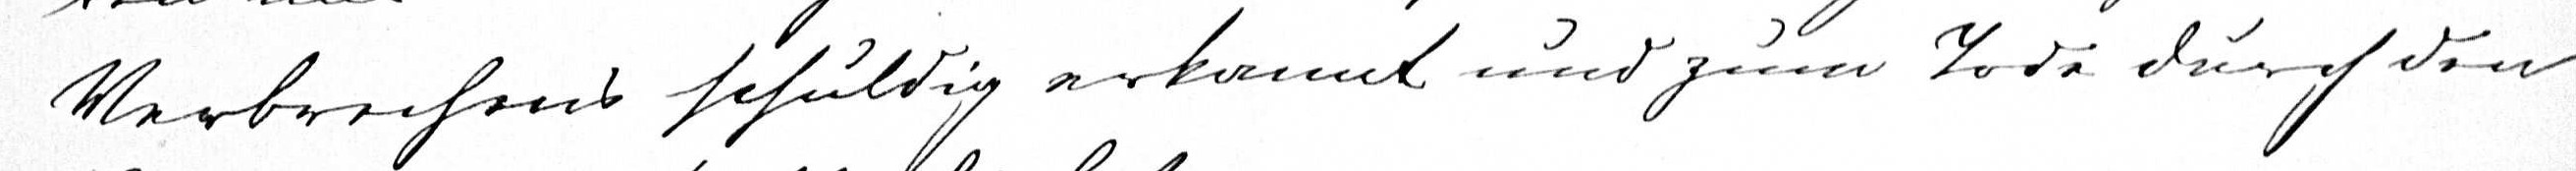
Verbrechens schuldig erkannt und zum Tode durch den
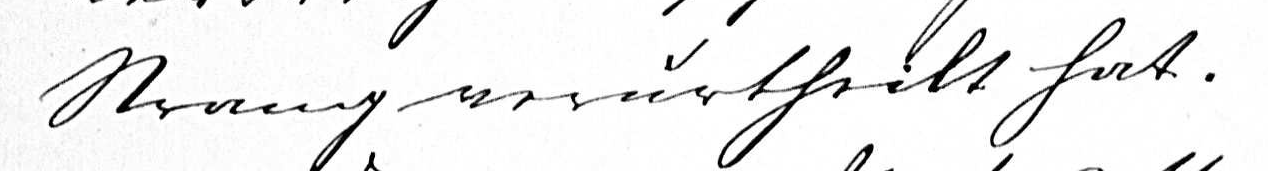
Strang verurtheilt hat.
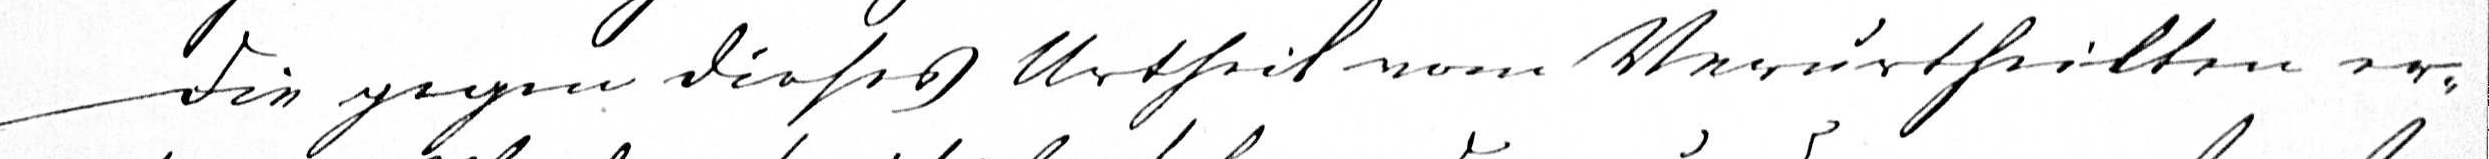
Die gegen dieses Urtheil vom Verurtheilten er¬
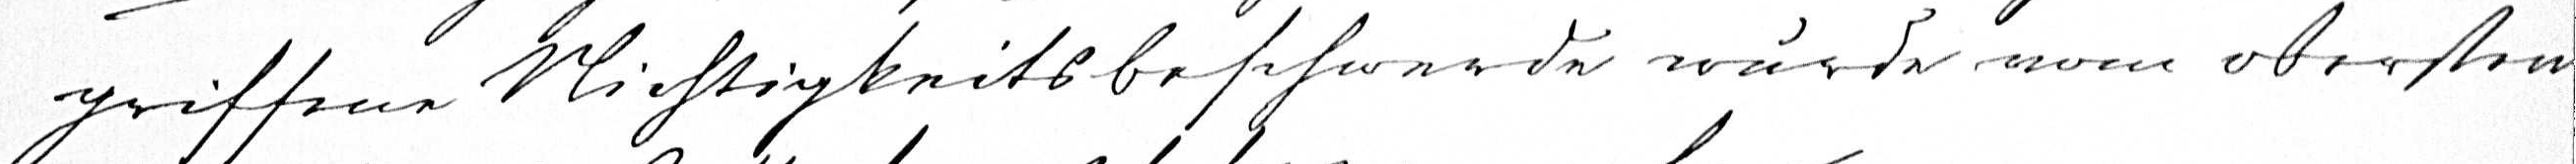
griffene Nichtigkeitsbeschwerde wurde vom obersten
